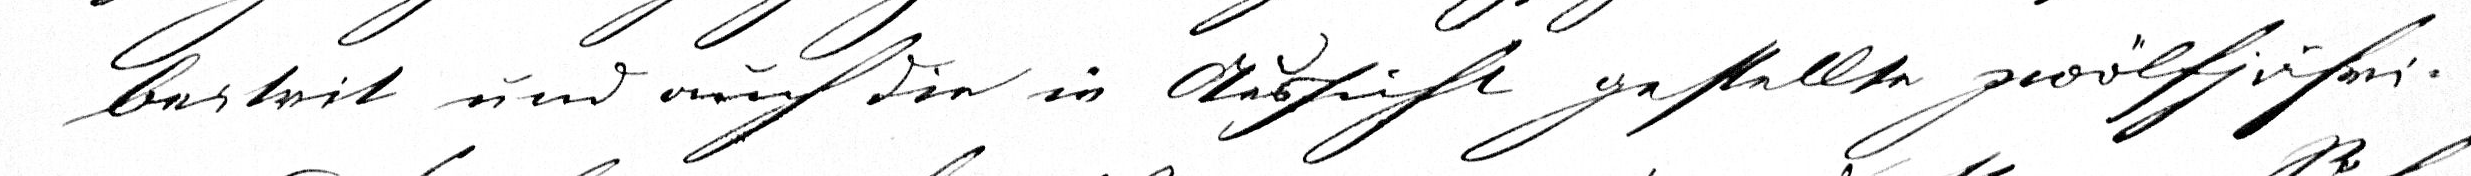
berxxit und auch die in Aussicht gestellte zwölfjähri¬
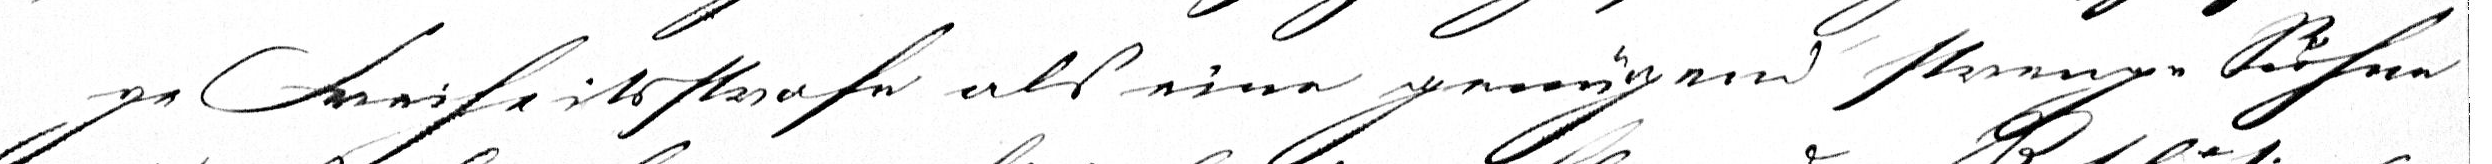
ge Freiheitsstrafe als eine genügend strenge Sühne
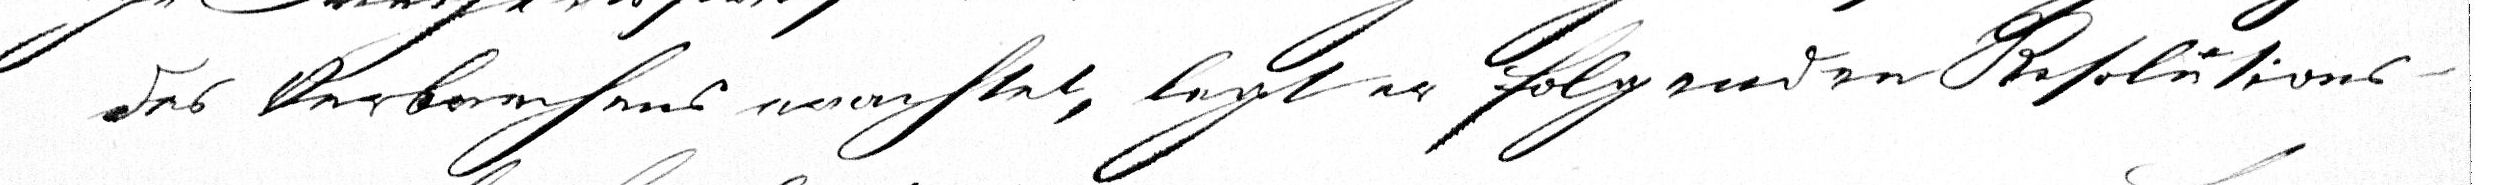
des Verbrechens ewachtet, legt er folgenden Resolutions¬
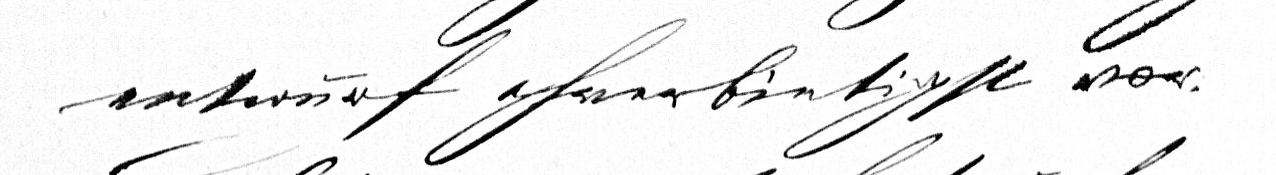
entwurf ehrerbietigst vor.
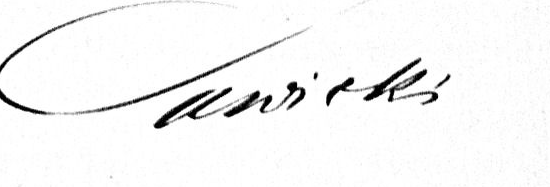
Sawicki
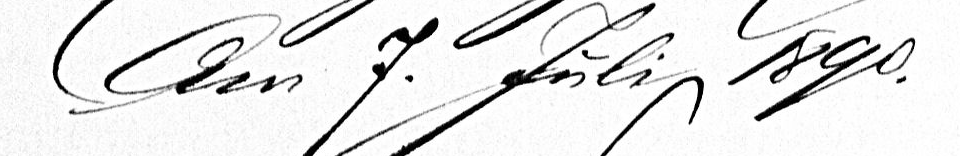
Am 7. Juli 1890.
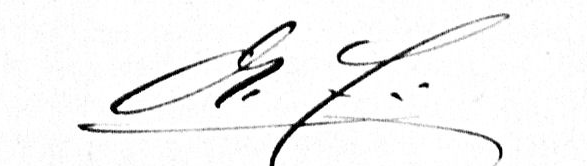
A. E.
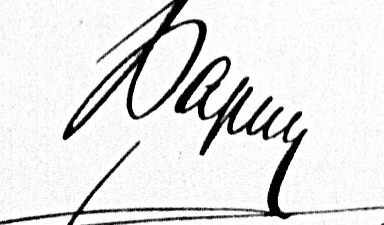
xx
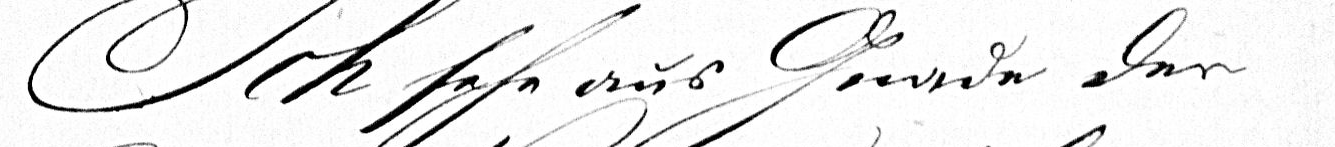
Ich sehe aus Gnade den
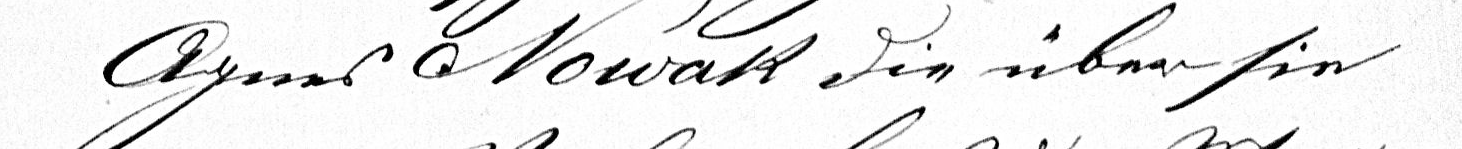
Agnes Nowak die über sie
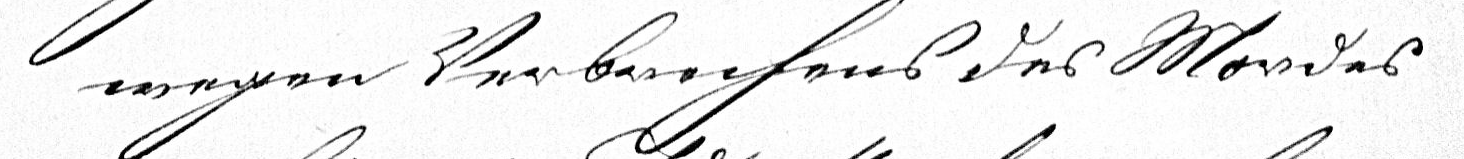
wegen Verbrechens des Mordes
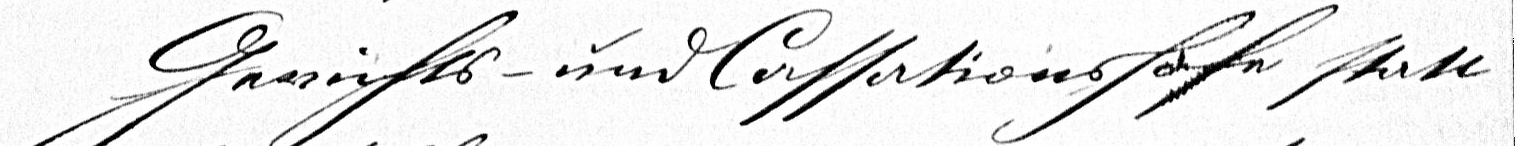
Gerichts- und Cassationshofe statt
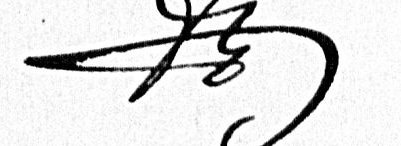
xx
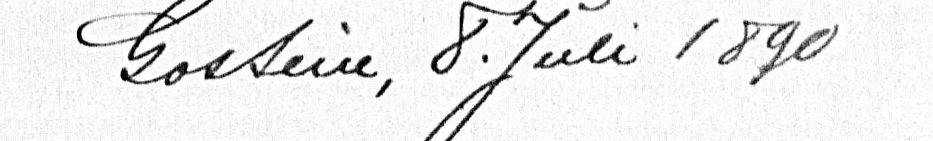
Gostein, 8. Juli 1890
